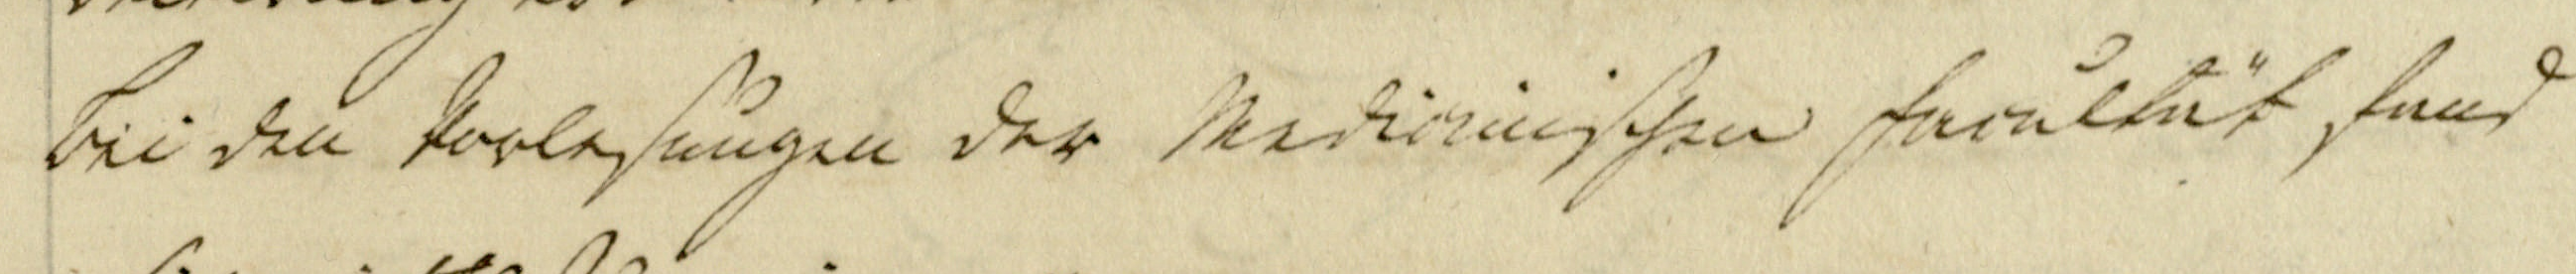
Bei den Vorlesungen der Medicinischen Facultät fand
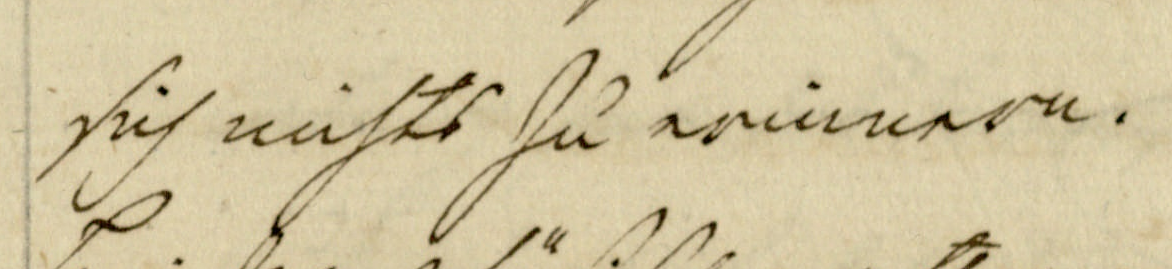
sich nichts zu erinnern.
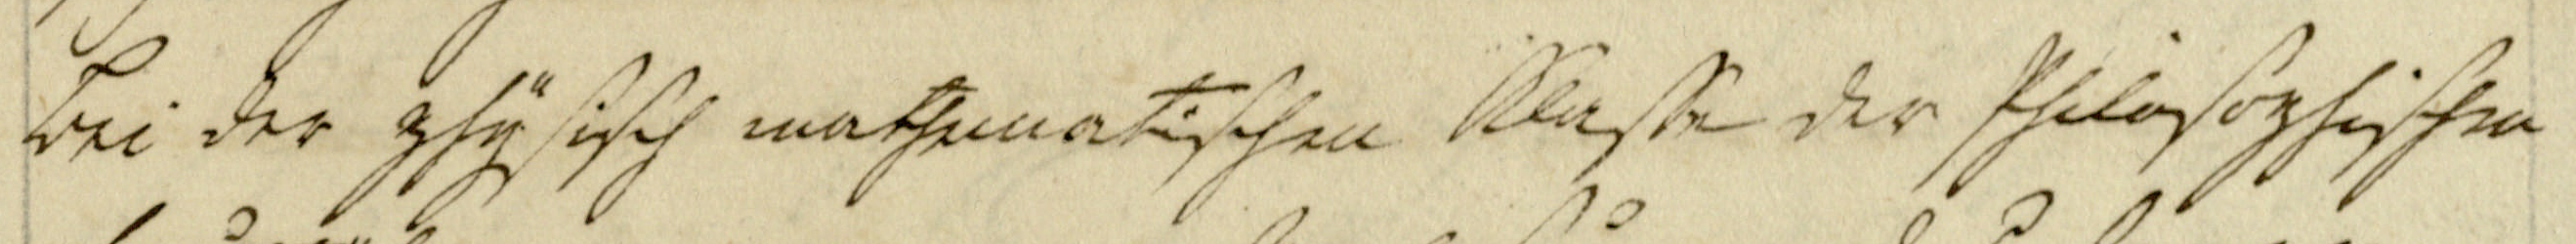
Bei der physisch mathematischen Klasse der Philosophischen
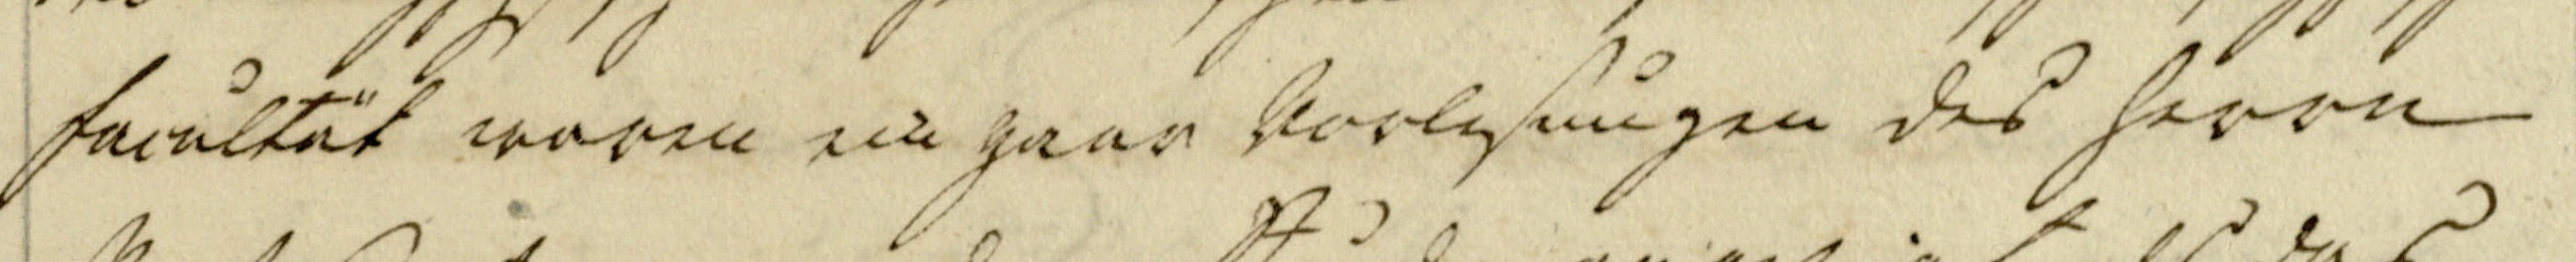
Facultät wären ein paar Vorlesungen des Herrn
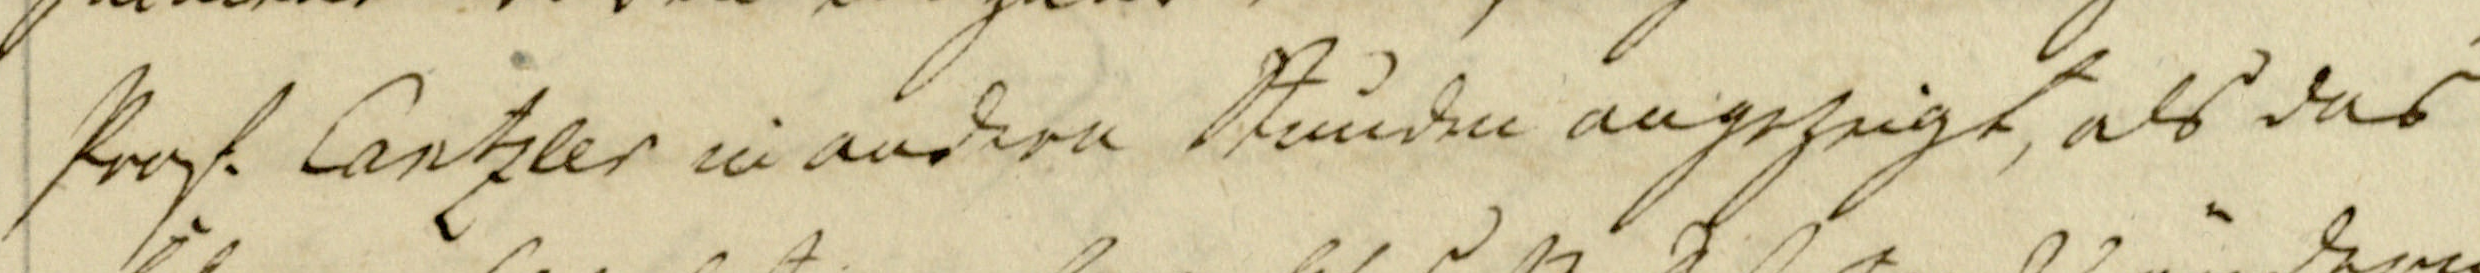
Prof. Cantzler in andern Stunden angezeigt, als das
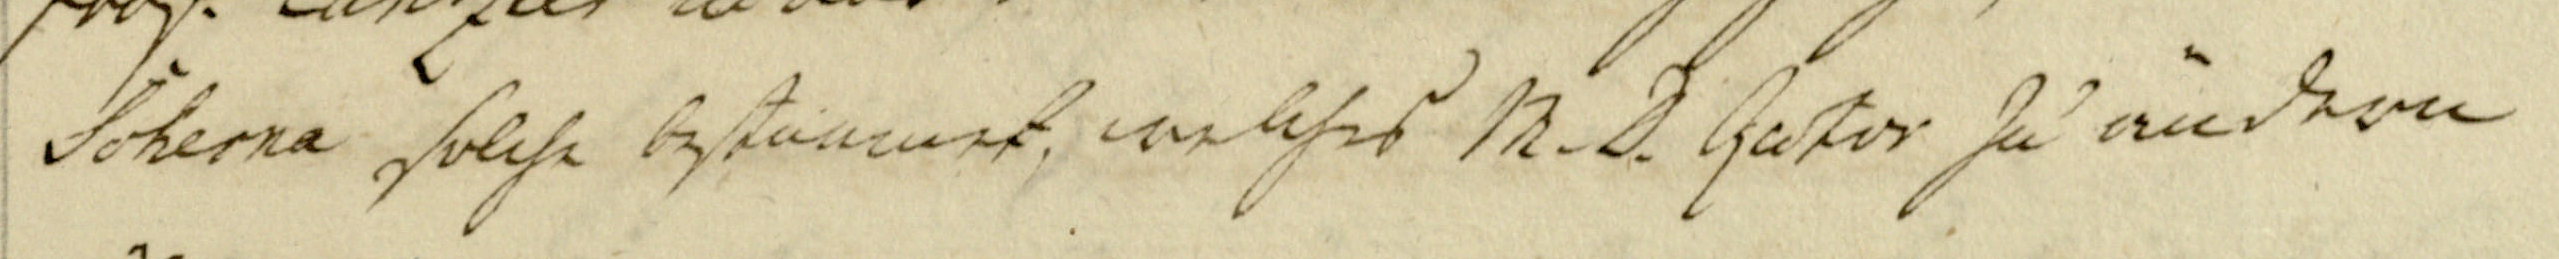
Schema solche bestimmet, welches M. D. Rector zu ändern
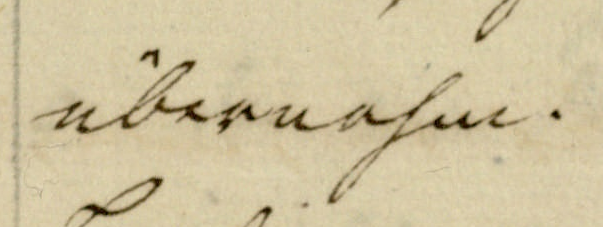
übernahm.
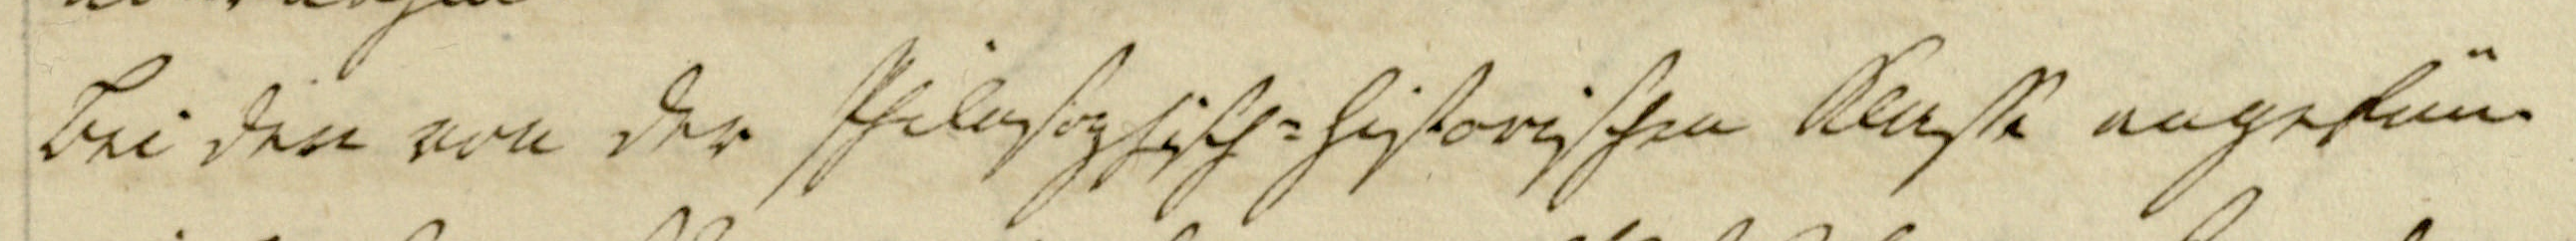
Bei den von der Philosophisch historischen Klasse angekün¬
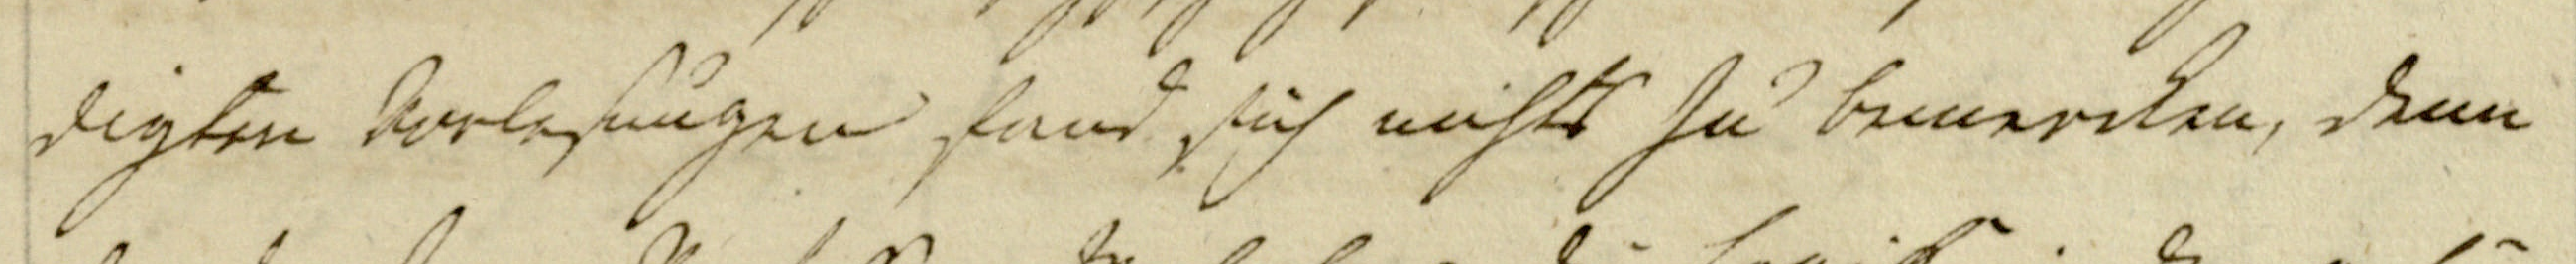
digten Vorlesungen fand sich nichts zu bemercken, denn
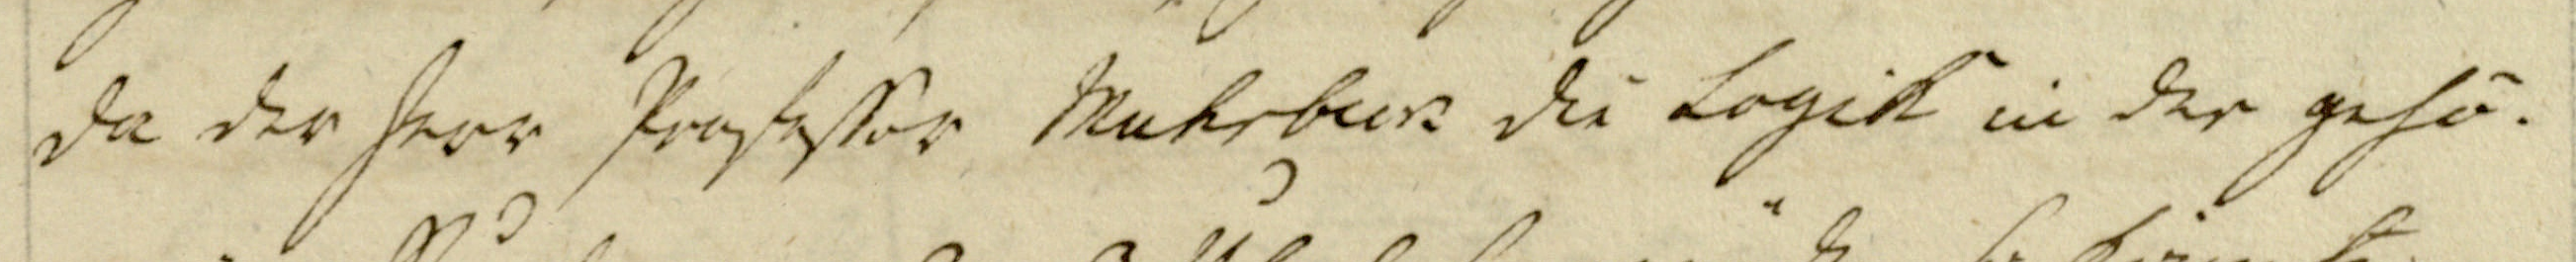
da der Herr Professor Muhrbeck die Logik in der gehö¬
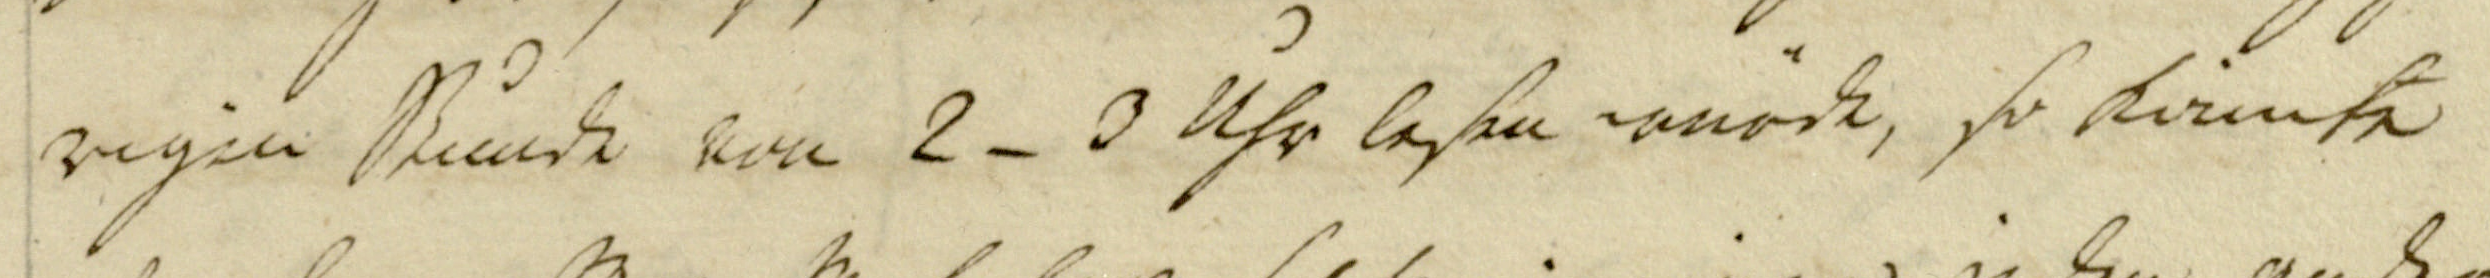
rigen Stunde von 2-3 Uhr lesen würde, so könnte
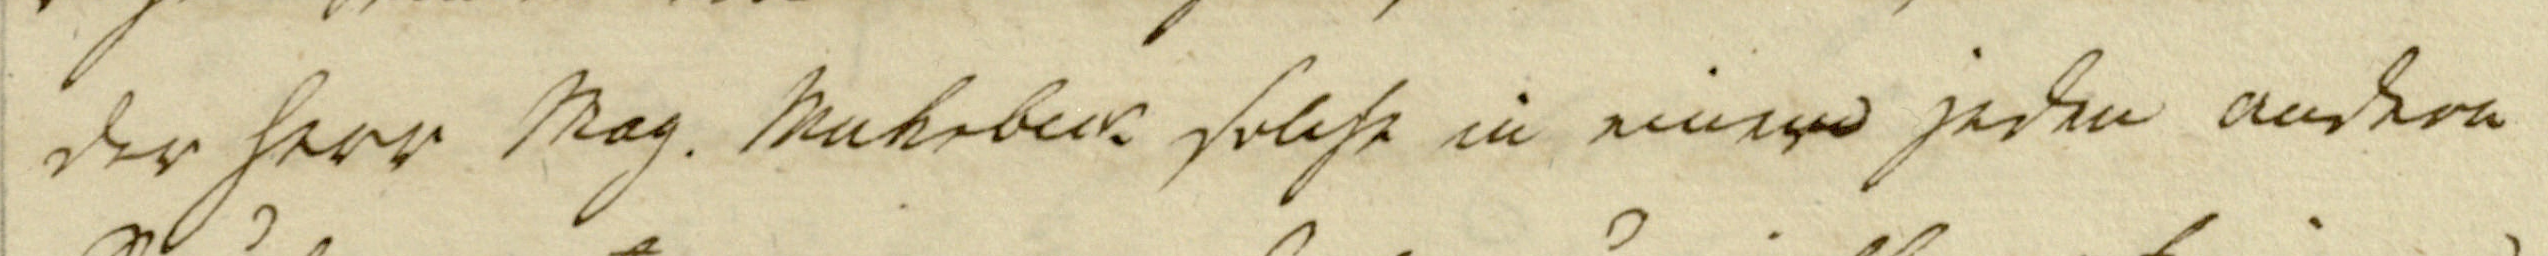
der Herr Mag. Muhrbeck solche in einer jeden andern
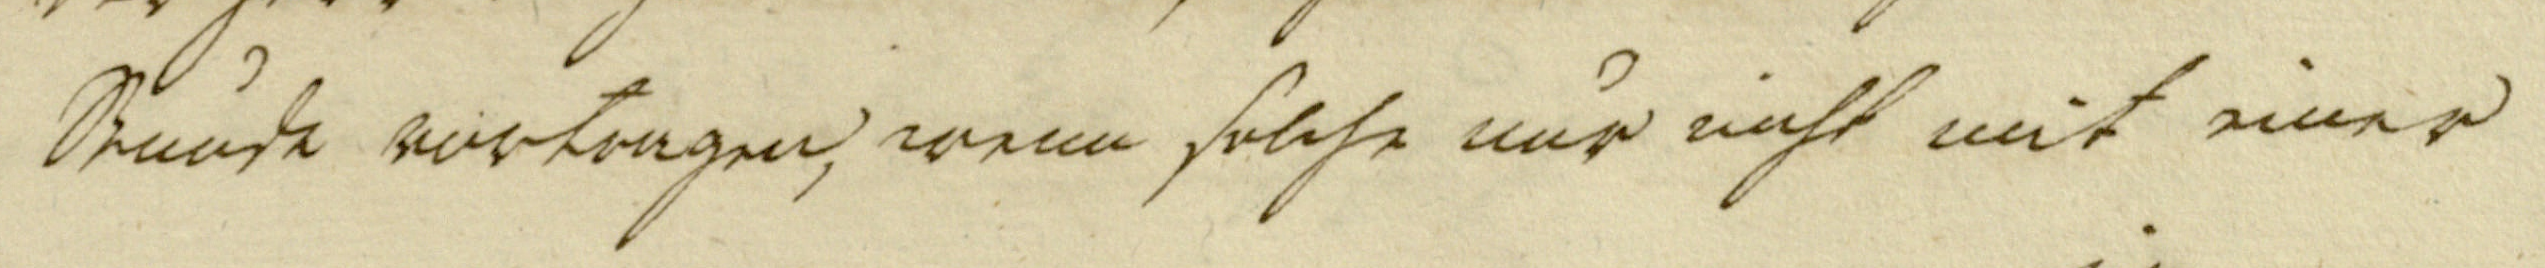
Stunde vortragen, wenn solche nur nicht mit einer
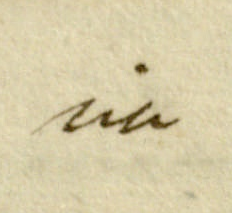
im
